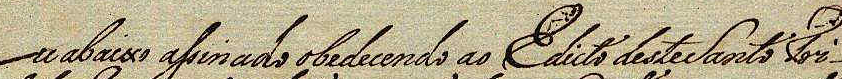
Eu abaixo assinado obedecendo ao Edicto deste Santo Tri
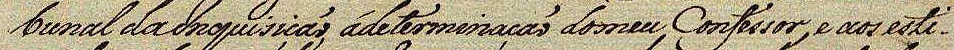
bunal da Inquisiçaõ, á determinaçaõ do meu Confessor, e aos esti
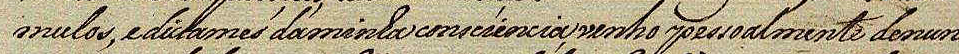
mulos, e dictames da minha consciencia, venho pessoalmente denun
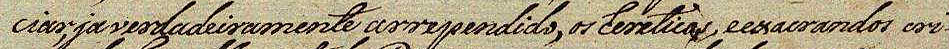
ciar, ja verdadeiramente arrependido, os hereticos, e exacrandos cri
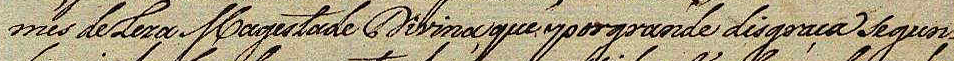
mes de Leza Magestade Divina, que por grande disgraça segun
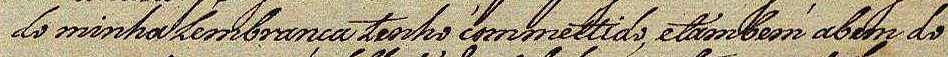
do minha lembrança tenho commettido, e tambem a bem do
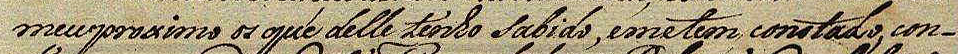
meu proximo os que delle tenho sabido, e me tem constado, con
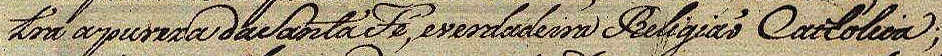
tra a pureza da Santa Fé, e verdadeira Religiaõ Catholica;
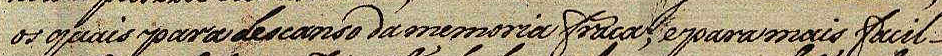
os quais para descanso da memoria fraca; e para mais facil
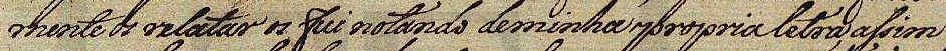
mente os relatar os fui notando de minha propria letra, assim
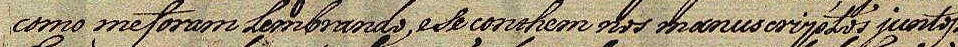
como me foram Lembrando, e se conthem nos manuscriptos juntos.
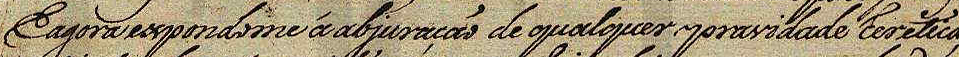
E agora expondome á abjuraçaõ de qualquer pravidade heretica,
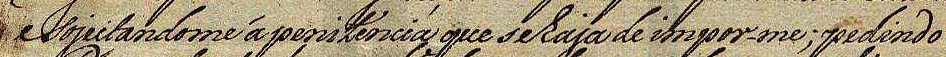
e Sojeitandome á penitencia, que se haja de impor me; pedindo
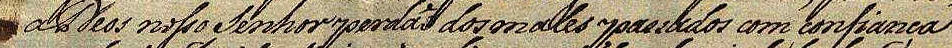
a Deos nosso Senhor perdaõ dos males passados com confiança
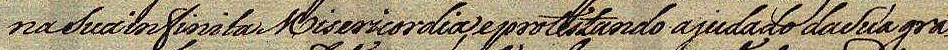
na Sua infinita Misericordia, e protestando ajudado da Sua gra
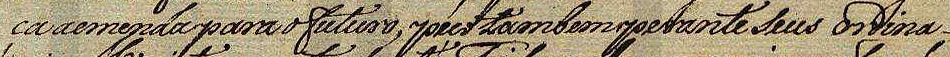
ça a emenda para o futuro, peço tambem perante seus ordina
